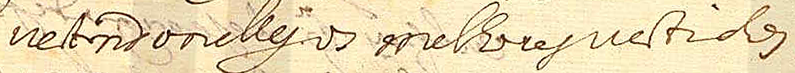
uestindo nelles os melhores uestidos
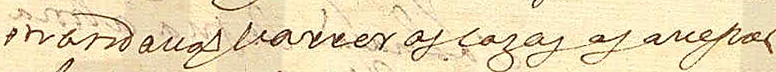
mandauaõ uarrer as cazas as auessas
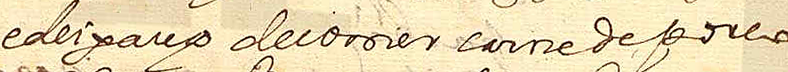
e deixauaõ de comer carne de porco
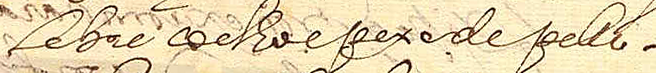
Lebre coelho e pexe de pelle
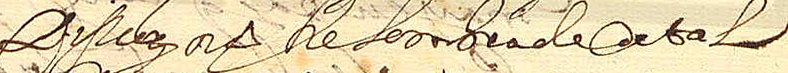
Disse q̄ naõ he Lembrado de taL
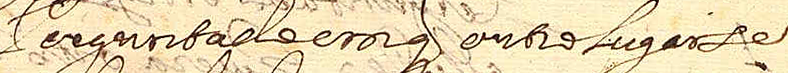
Perguntado em q̄ outro Lugar se
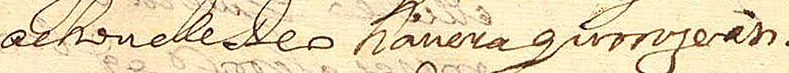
achou elle Reo hauera quinze an
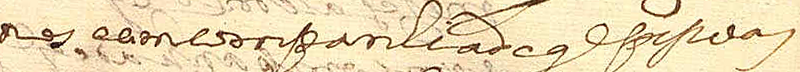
nos e em companhia de q̄ pessoas
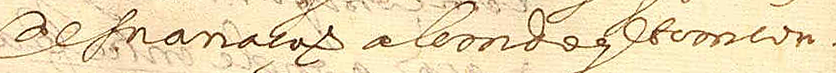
de sua naçaõ alem do q̄ tem con
